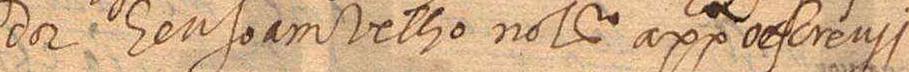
dor E eu Joam velho notro appco o escreujj
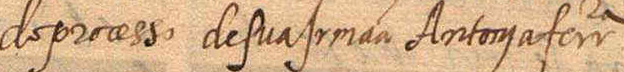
do processo de sua Jrmaã Antonja ferrra
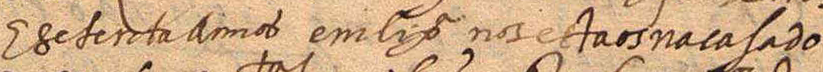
E setenta annos em lixa nos estaos na casa do
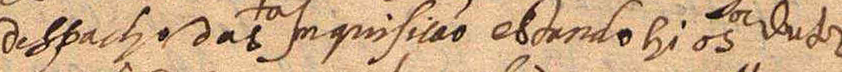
despacho da sta Jnquisicão estando hi o sor doutor
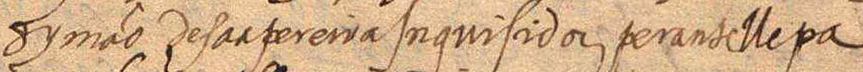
symaõ de saa pereira Jnquisidor perantelle pa
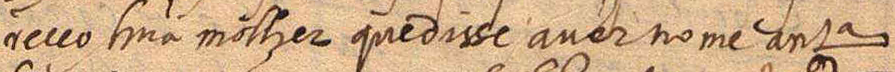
receo hu̅a molher que disse auer nome de anta
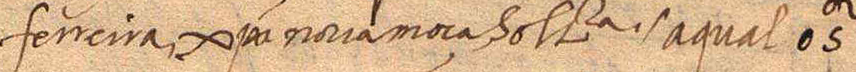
ferreira, xpã noua moça soltra / a qual o sor
